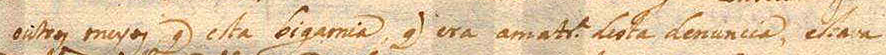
outros meyos q̄ esta bigamia, q̄ era a matr.a desta denuncia, estava
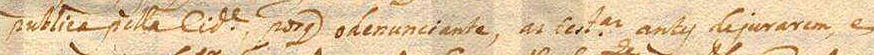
publica pella Cid.e porq̄ o denunciante, as test.as antes de jurarem, e
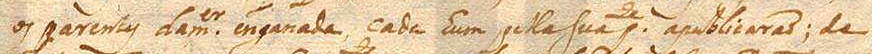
os parentes da m.er enganada, cada hum pella sua p.te a publicaraõ; de
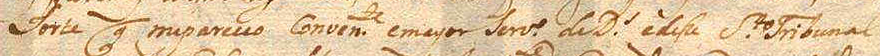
sorte q̄ me pareceo conven.te e mayor Serv.o de D.s e desse S.to Tribunal
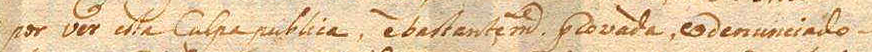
por ver esta Culpa publica, e bastantem.te provada, e o denunciado
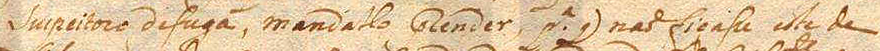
suspeitozo de fuga, mandallo pRender, p.a q̄ naõ ficasse este de
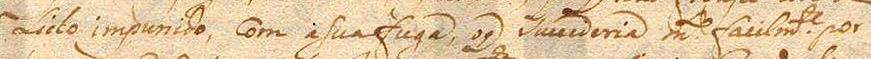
Licto impunido, com a sua fuga, o q̄ succederia m.to facilm.te por
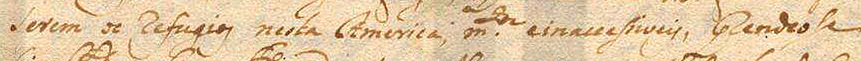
serem os Refugios nesta America; m.tos e inaccessiveis, pRendeose
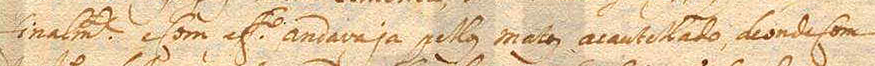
finalm.te e Com eff.o andava ja pellos matos acautellado, de onde Com
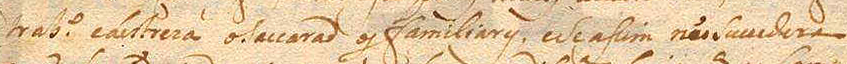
trab.o e destreza o saccaraõ os familiares; e se assim não succedera
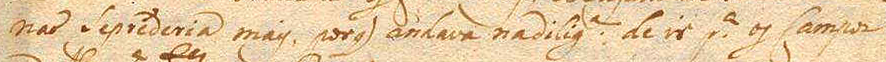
naõ se prēderia mais, porq̄ andava na dilig.a de ir p.a os Campos
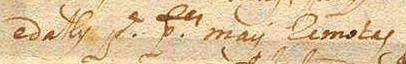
e dally p.a p.tes mais Remotas.
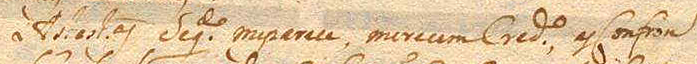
As test.as Seg.do me parece, merecem Cred.o, as Confron
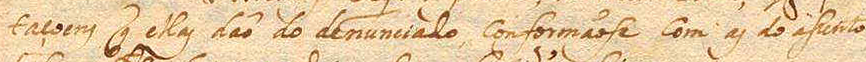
taçoens q̄ ellas daõ do denunciado, conformaõse com as do assunto
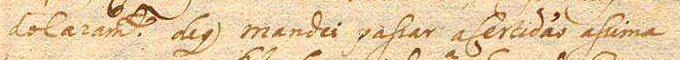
do Cazam.to de q̄ mandei passar a Certidaõ assima
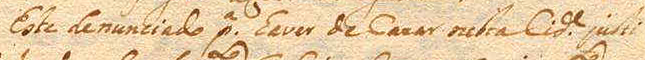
Este denunciado p.a haver de Cazar nesta Cid.e justi
